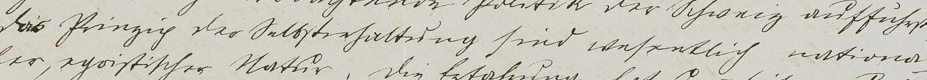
das Prinzip der Selbsterhaltung sind wesentlich nationa-
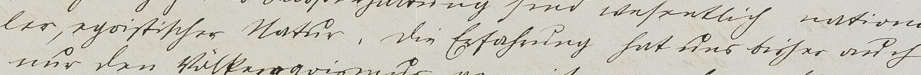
ler, egoistischer Natur, die Erfahrung hat uns bisher auch
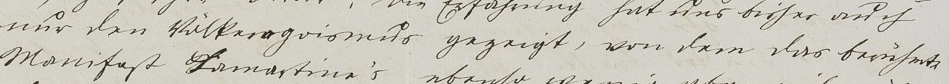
nur den Völkeregoismus gezeigt, von dem das berühmte
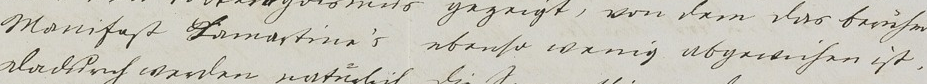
Manifest Lamartine's ebenso wenig abgewichen ist.
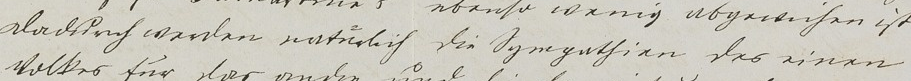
Dadurch werden natürlich die Sympathien des einen
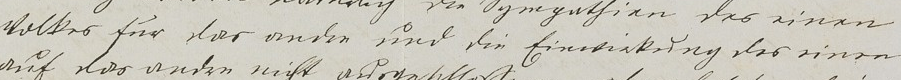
Volkes für das andre und die Einwirkung des einen
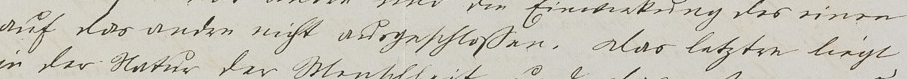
auf das andre nicht ausgeschlossen. Das letztre liegt
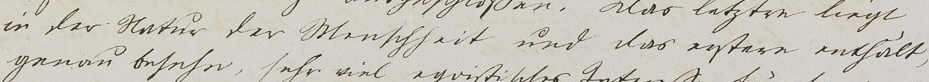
in der Natur der Menschheit und das erstere enthält,
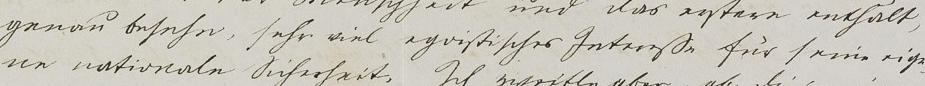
genau besehn, sehr viel egoistisches Interesse für seine eige-
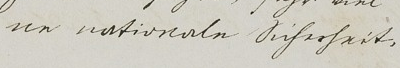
ne nationale Sicherheit.
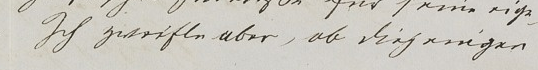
Ich zweifle aber, ob diejenigen
